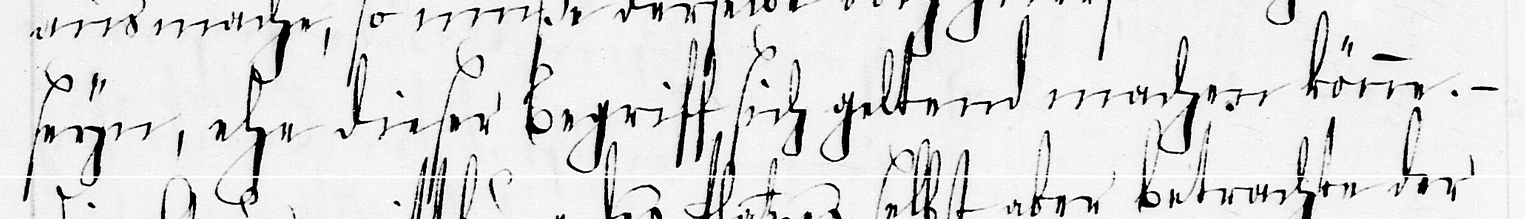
seyn, ehe dieser Begriff sich geltend machen könne.
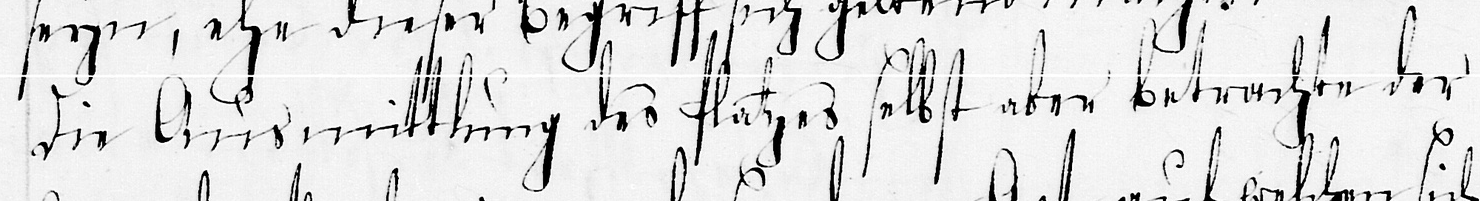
Die Ausmittlung des Platzes selbst aber betrachte der
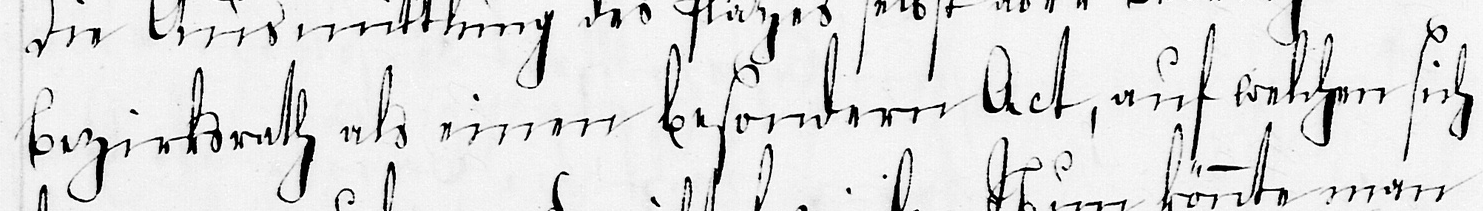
Bezirksrath als einen besondern Act, auf welchen sich
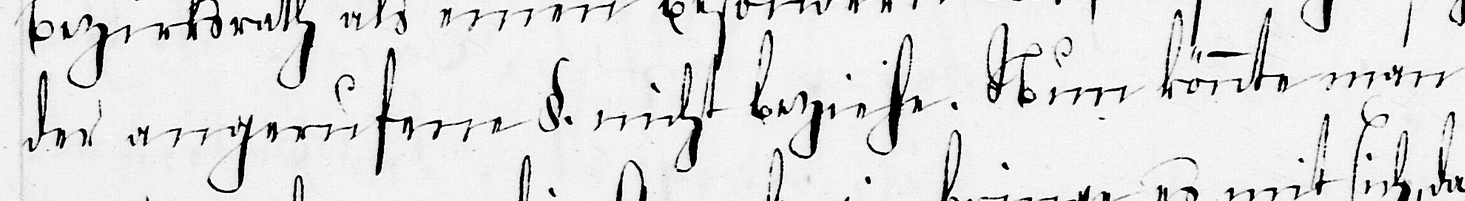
der angerufene §. nicht beziehe. Nun könnte man
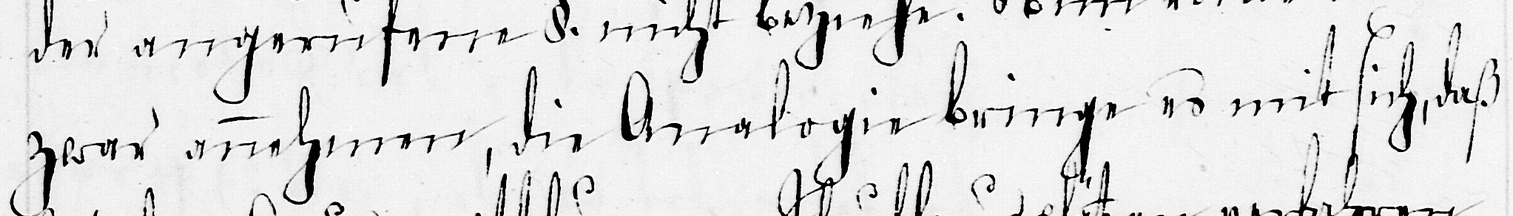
zwar annehmen, die Analogie bringe es mit sich, daß
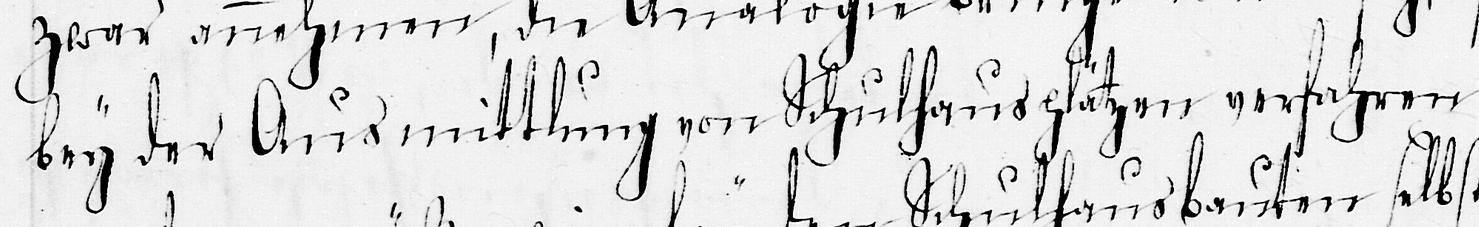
bey der Ausmittlung von Schulhausplätzen verfahren
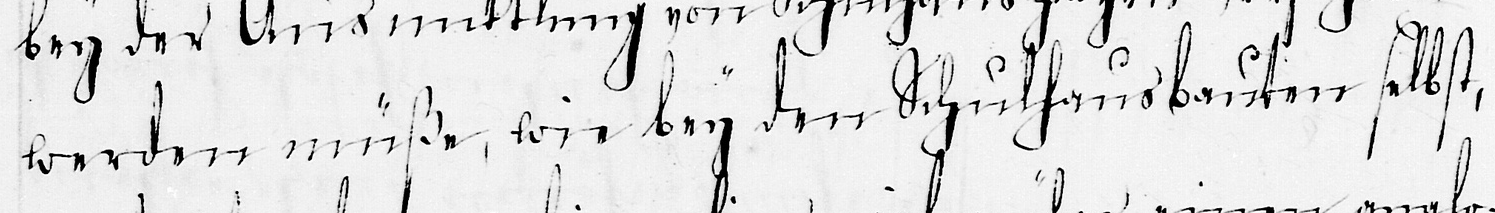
werden müße, wie bey den Schulhausbauten selbst,
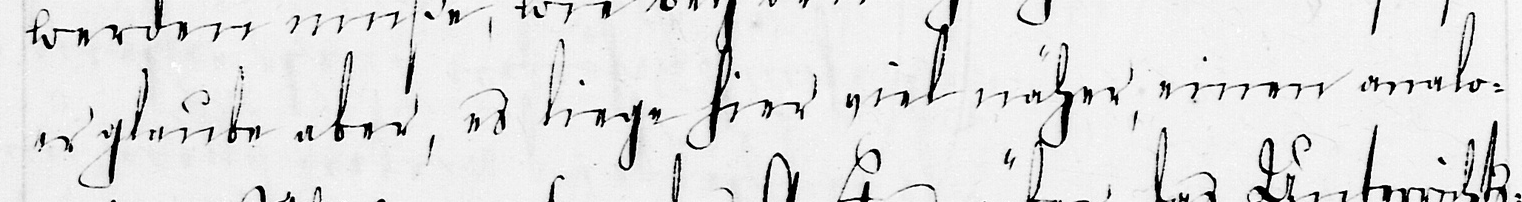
er glaube aber, es liege hier viel näher, einen analo¬
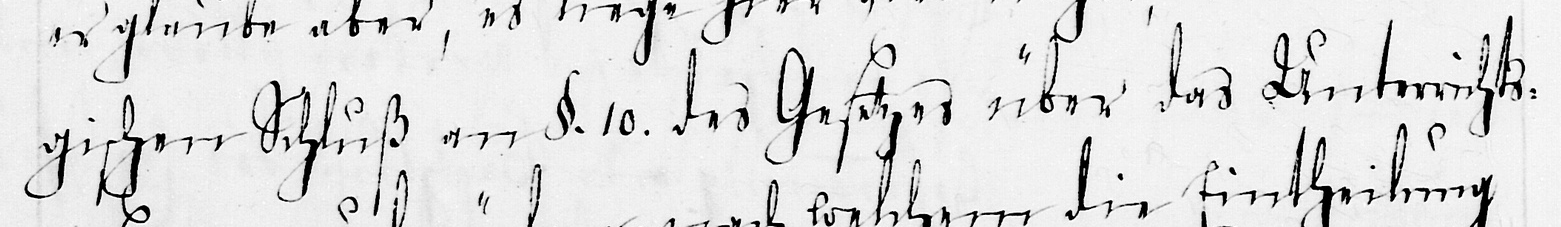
gischen Schluß an §. 10. des Gesetzes über das Unterrichts¬
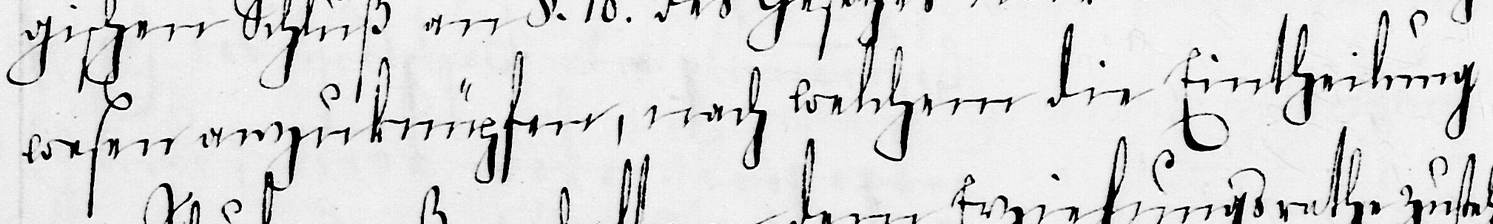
wesen anzuknüpfen, nach welchem die Eintheilung
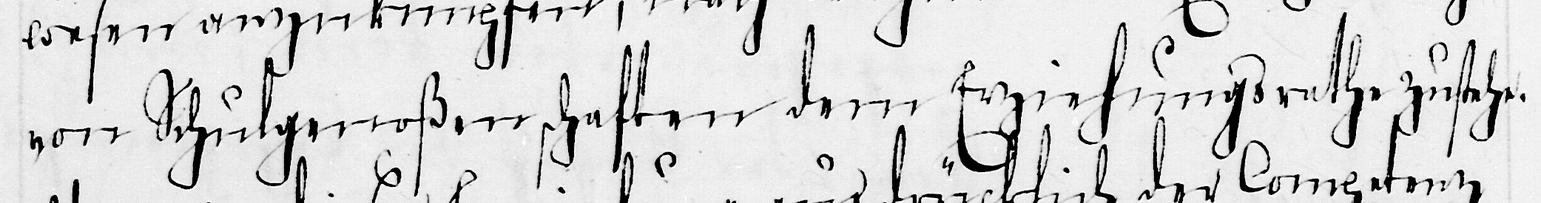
von Schulgenoßenschaften dem Erziehungsrathe zusteh¬
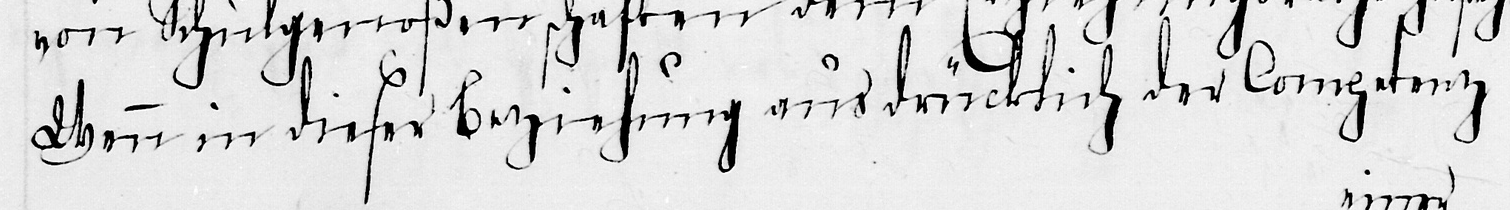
Wenn in dieser Beziehung ausdrücklich der Competenz
